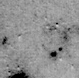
n.
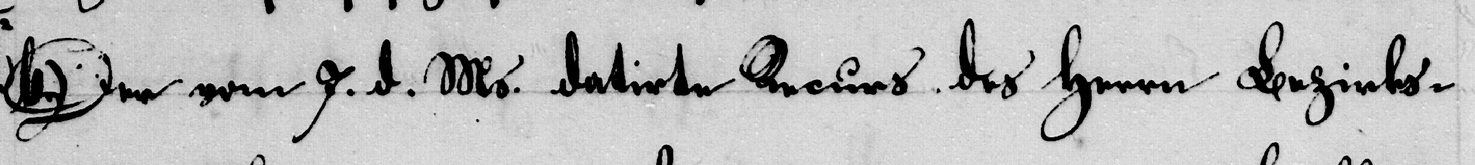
b.) Der vom 7. d. Ms. datirte Recurs des Herrn Bezirks¬
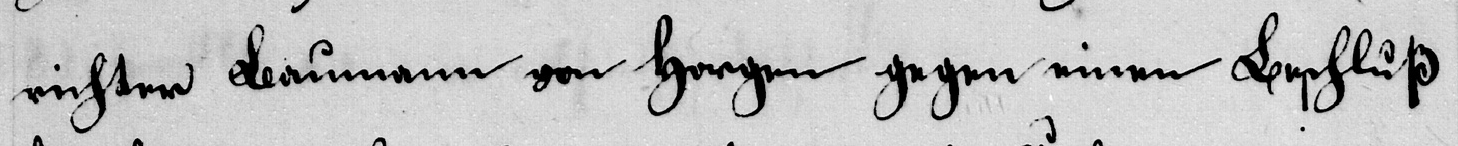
richter Baumann von Horgen gegen einen Beschluß
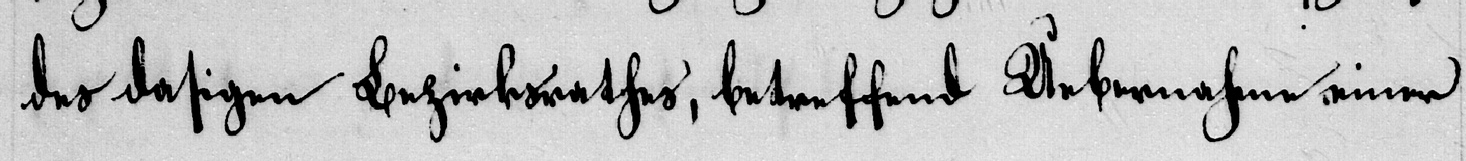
des dasigen Bezirksrathes, betreffend Uebernahme einer
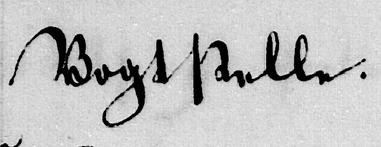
Vogtstelle.
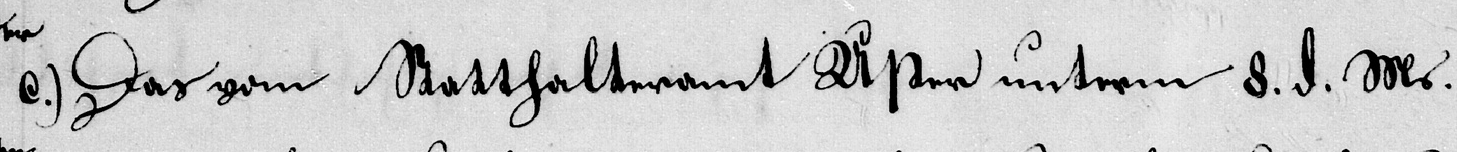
d.) Die vom Statthalteramt Horgen unterm 9. d. Ms.
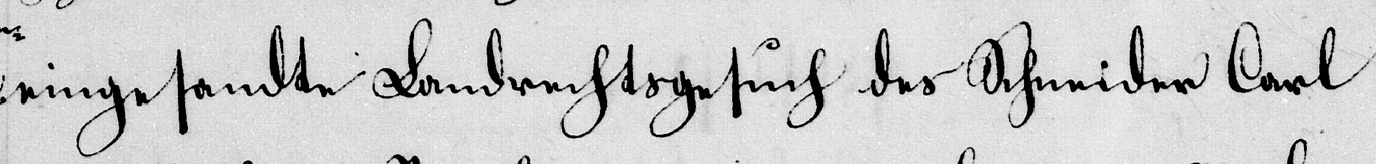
eingesandte Landrechtsgesuch des Schneider Carl
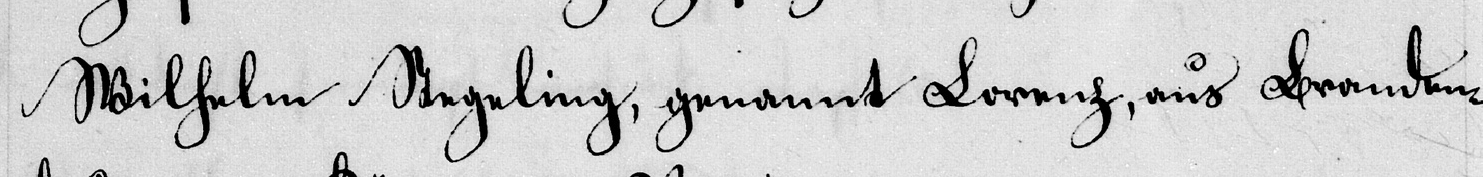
Wilhelm Stegeling, genannt Lorenz, aus Branden¬
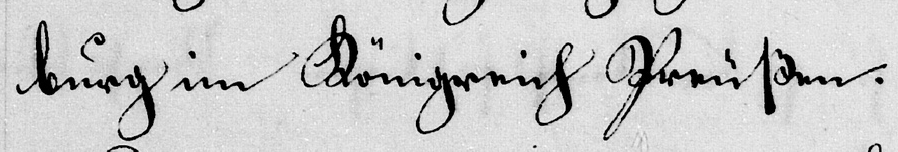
burg im Königreich Preußen.
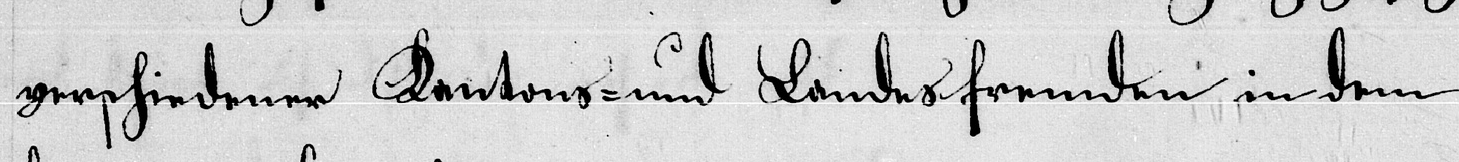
verschiedener Kantons- und Landesfremden in den
